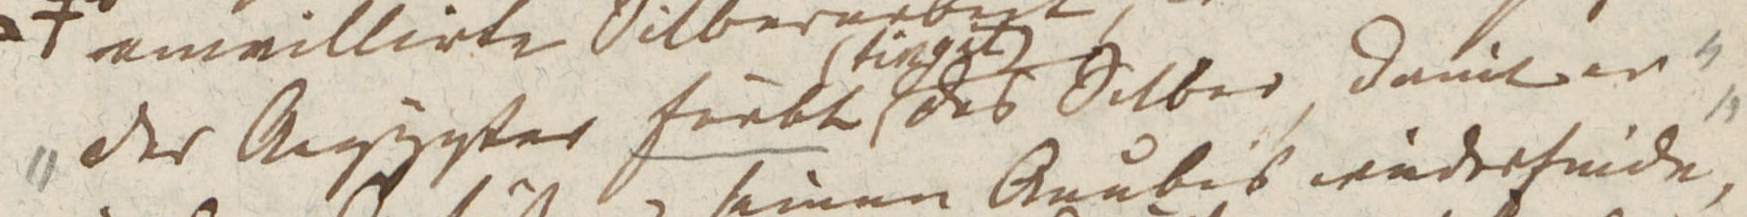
"der Aegypter färbt tingit das Silber, damit er"
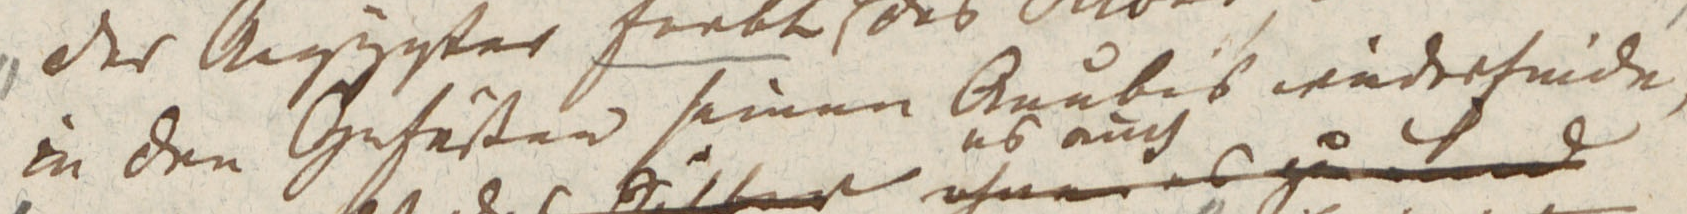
"in den Gefässen seinen Anubis wiederfinde,"
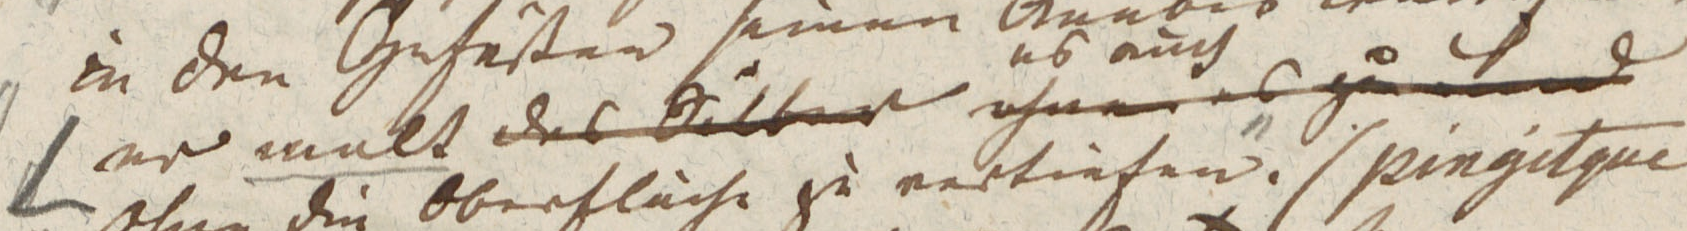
"%er malt das Silber ohne es zu und
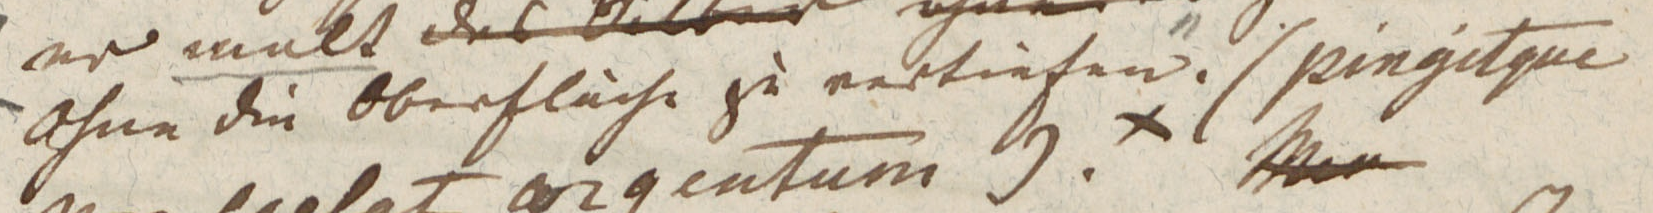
"Ohne die Oberfläche zu vertiefen". (pingitque
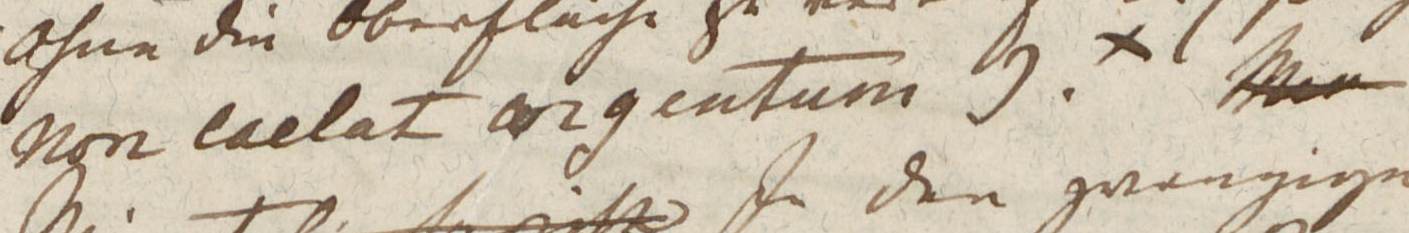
non caelat argentum.% Min
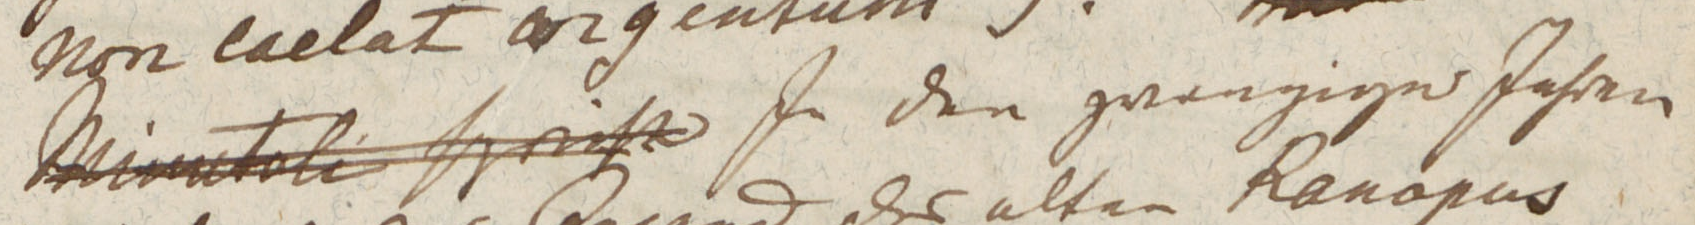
Minutoli spricht In den zwanziger Jahren
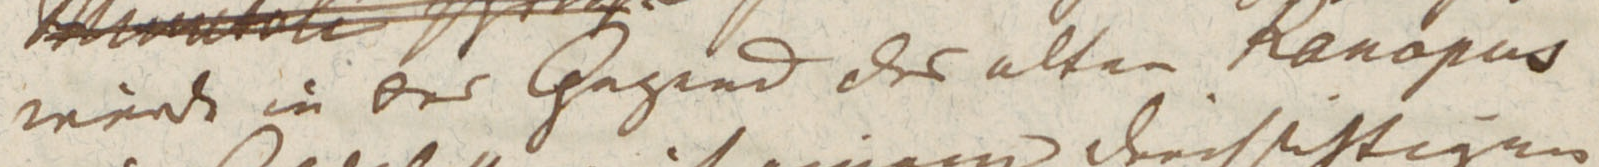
wurde in der Gegend des alten Kanopus
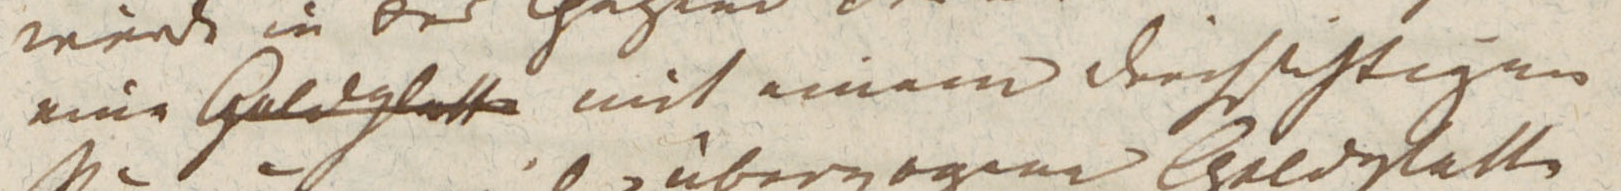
eine Goldplatte mit einem durchsichtigen
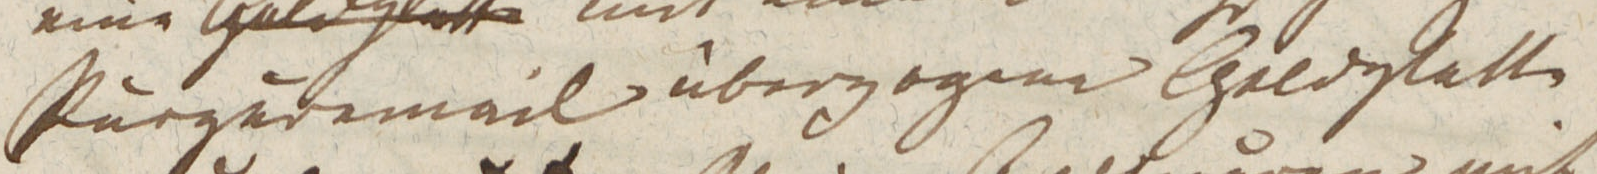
Purpuremail überzogene Goldplatte
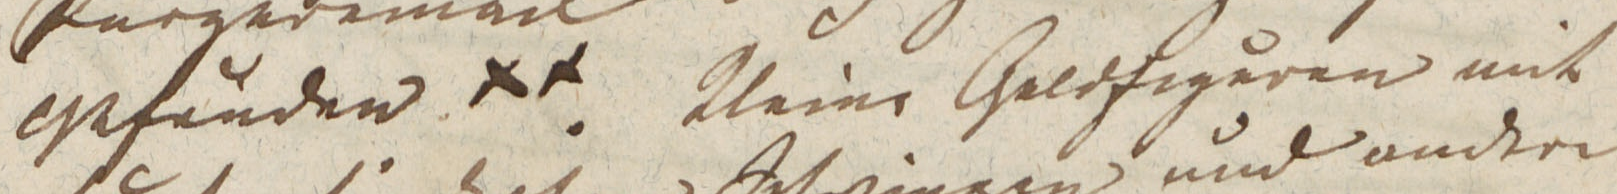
gefunden%. Kleine Goldfiguren mit
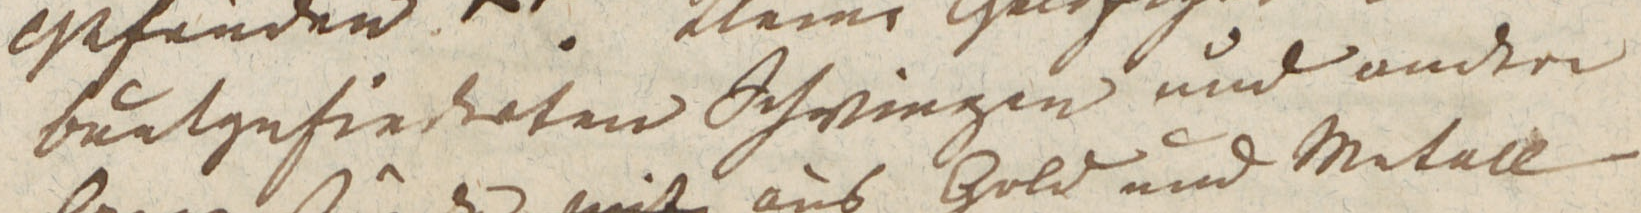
buntgefiederten Schwingen und andere
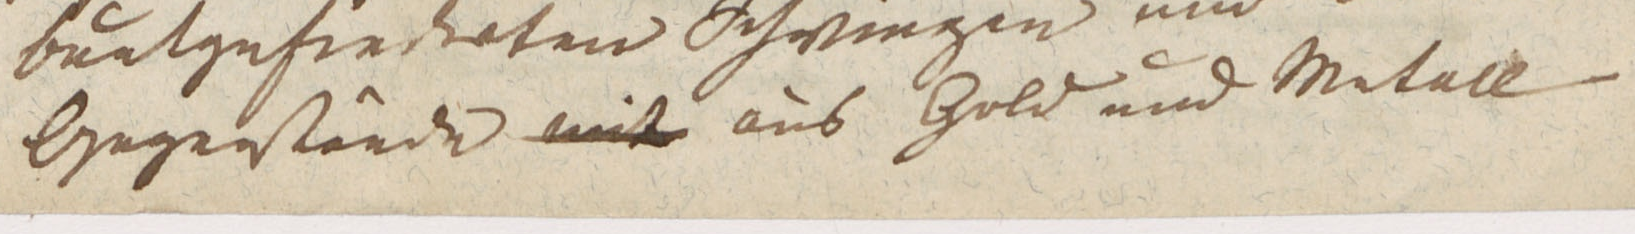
Gegenstände mit aus Gold und Metall
